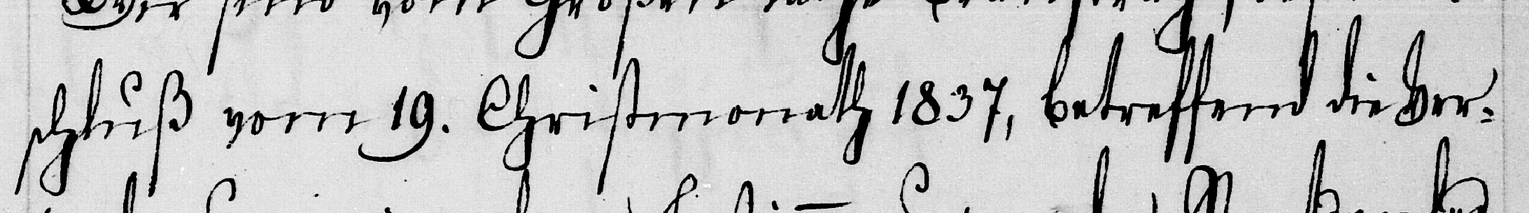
schluß vom 19. Christmonath 1837, betreffend die Ver¬
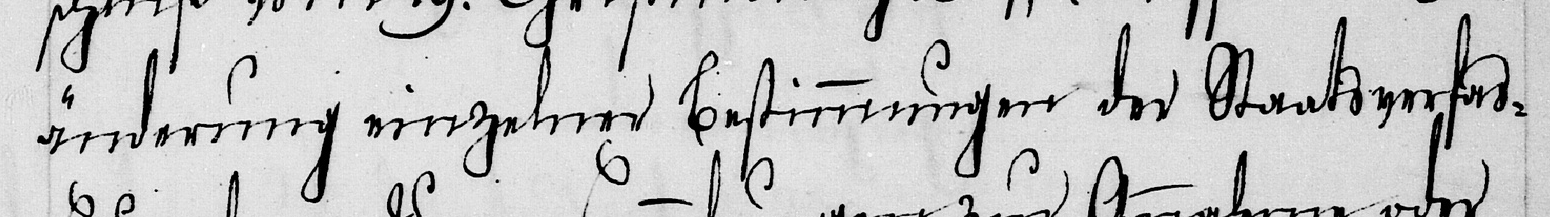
änderung einzelner Bestimmungen der Staatsverfas¬
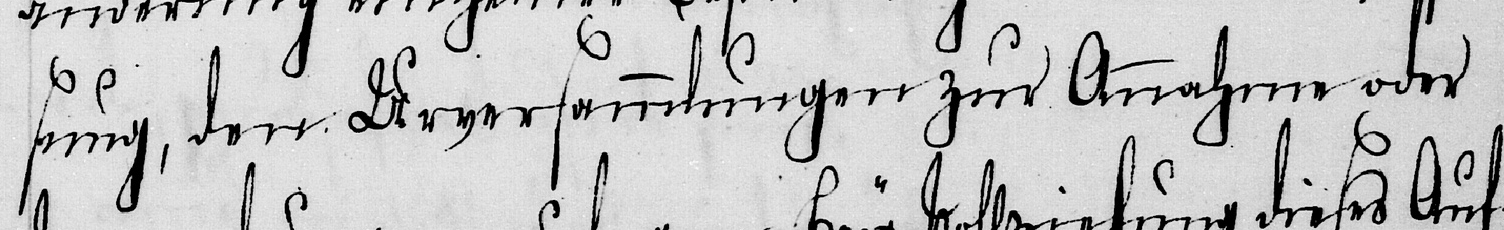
sung, den Urversammlungen zur Annahme oder
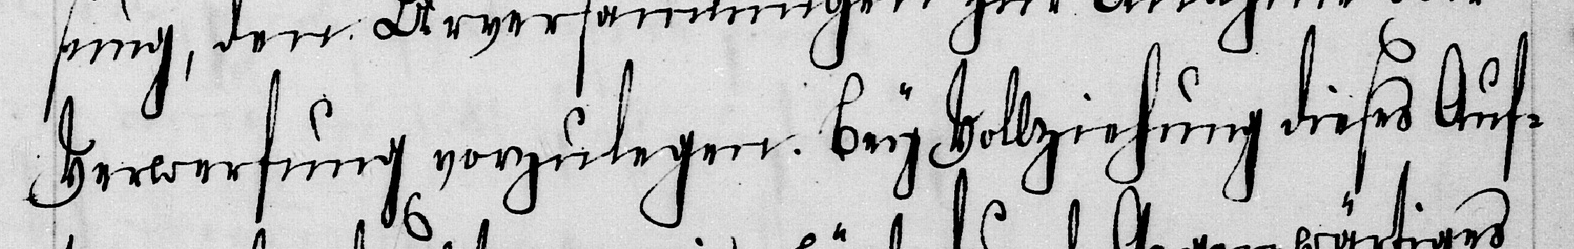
Verwerfung vorzulegen. Bey Vollziehung dieses Auf¬
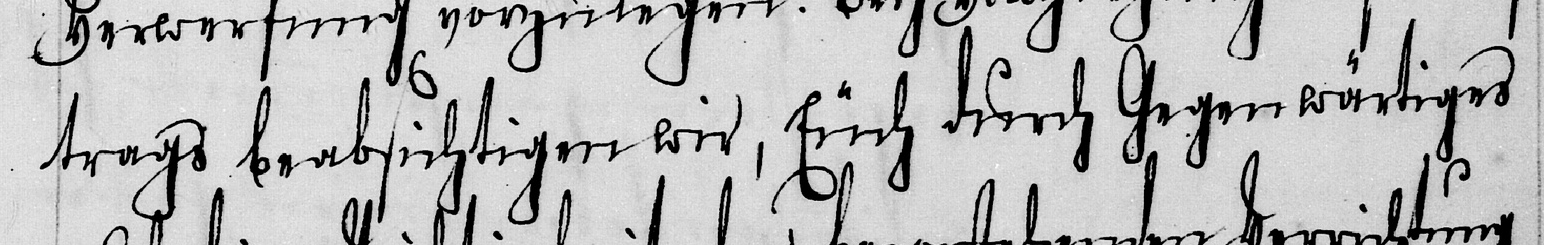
trags beabsichtigen wir, Euch durch Gegenwärtiges
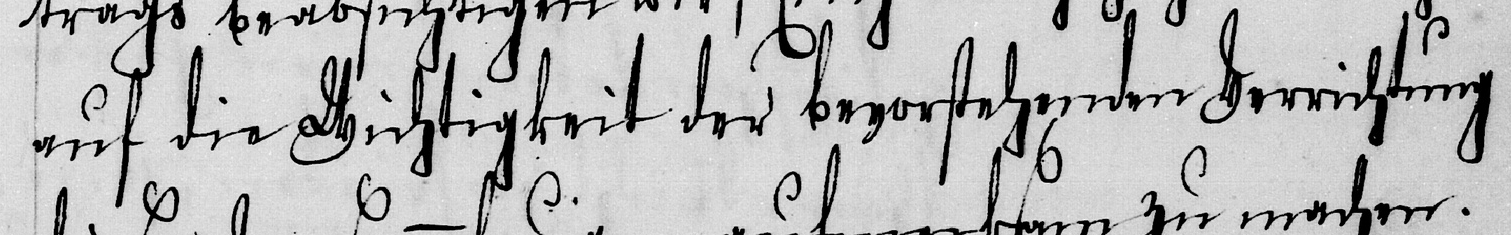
auf die Wichtigkeit der bevorstehenden Verrichtung
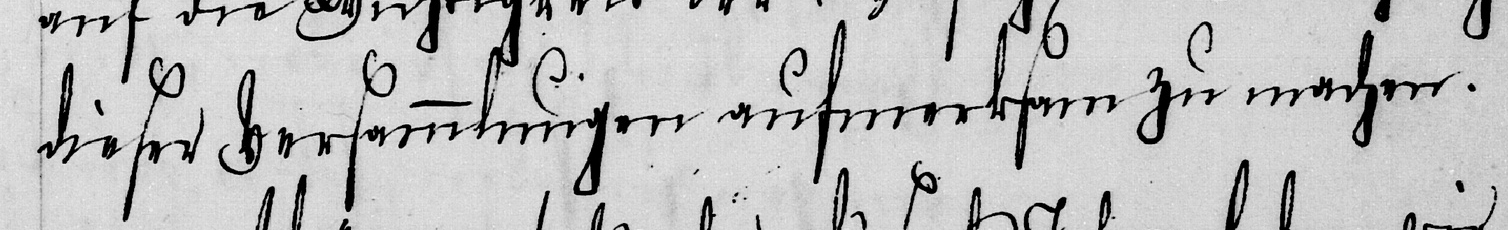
dieser Versammlungen aufmerksam zu machen.
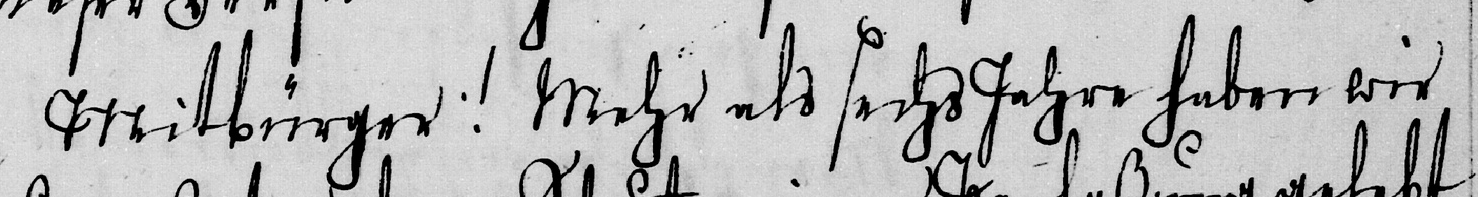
Mitbürger! Mehr als sechs Jahre haben wir
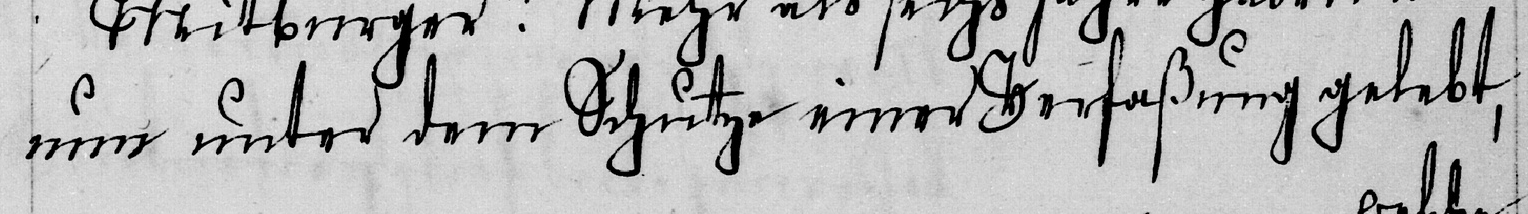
nun unter dem Schutze einer Verfaßung gelebt,
